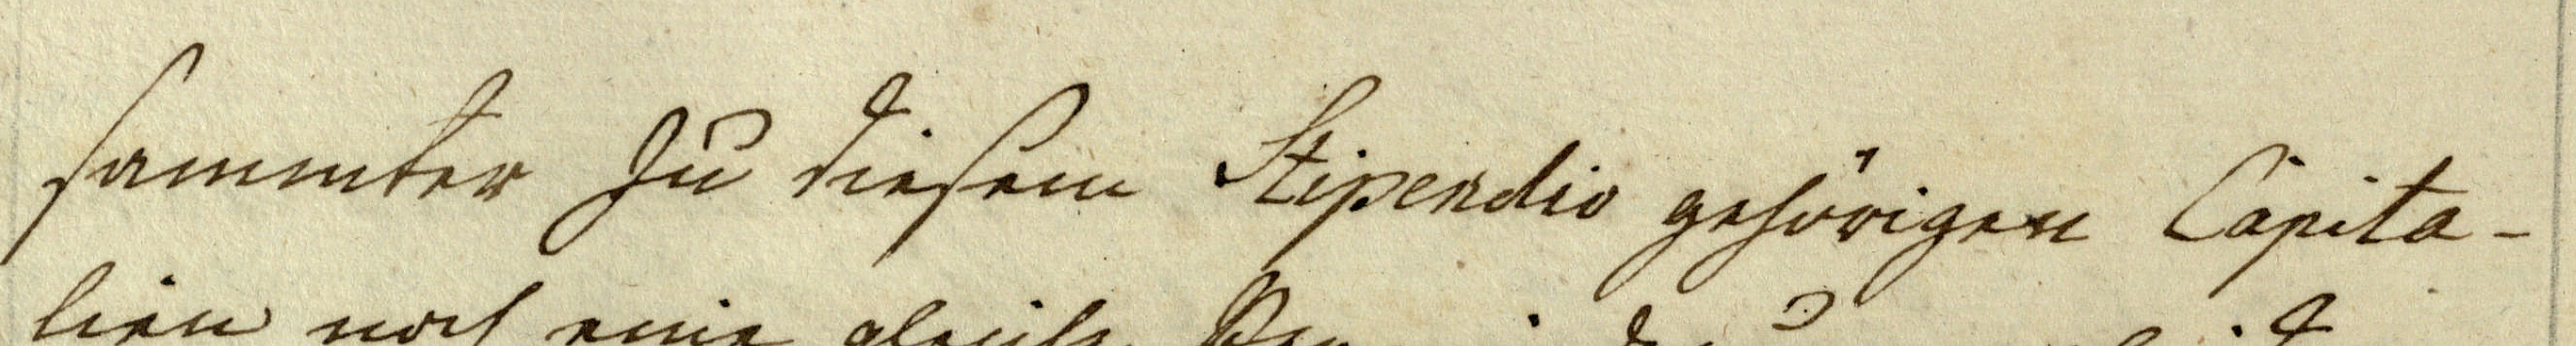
sammter zu diesem Stipendio gehörigen Capita¬
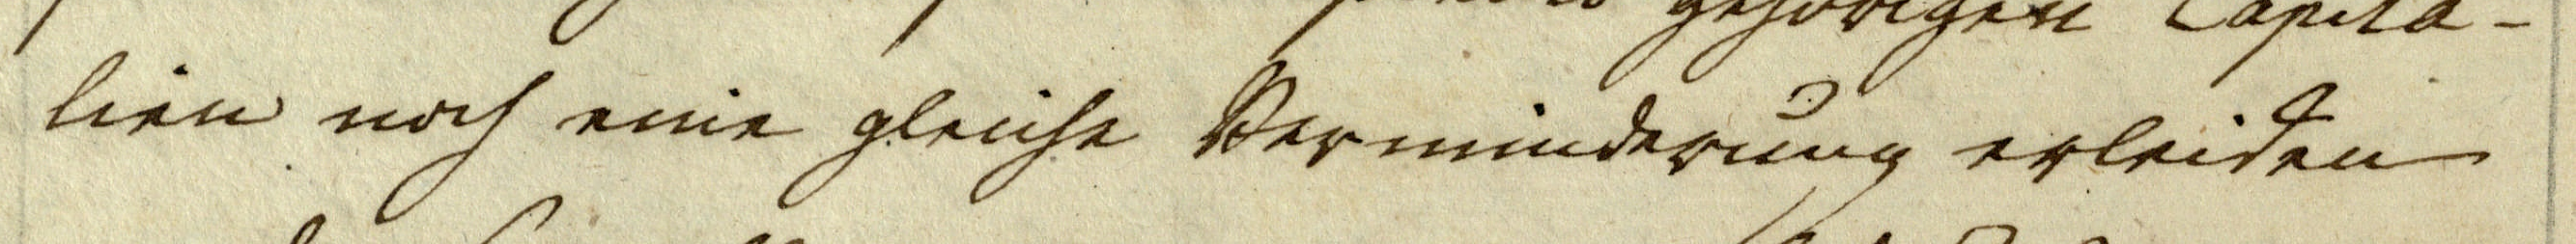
lien noch eine gleiche Verminderung erleiden
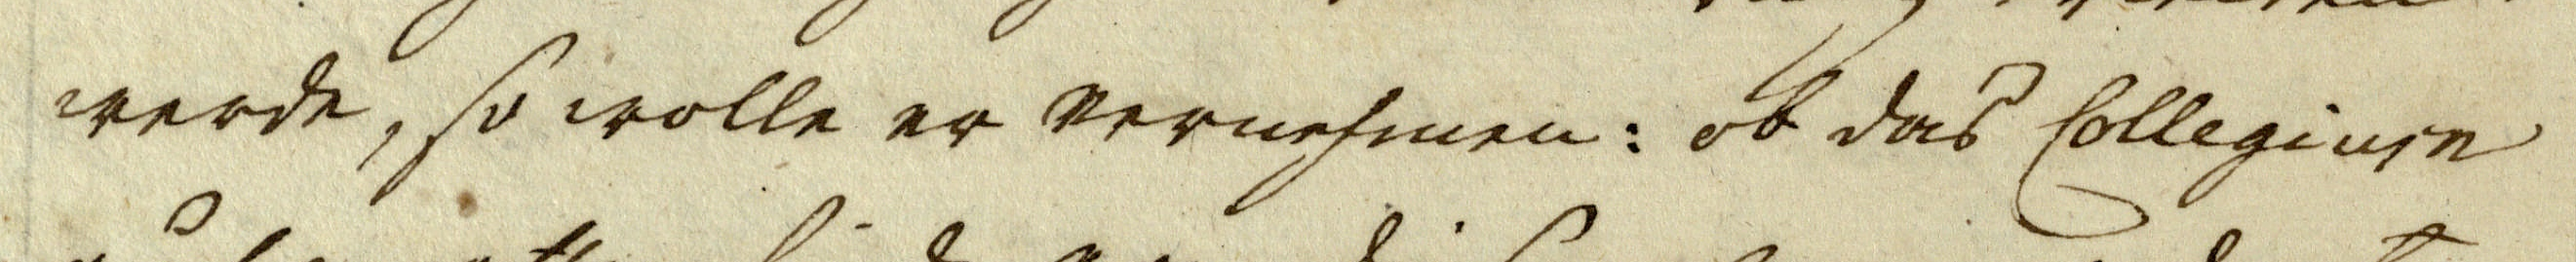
werde, so wolle er vernehmen: ob das Collegium
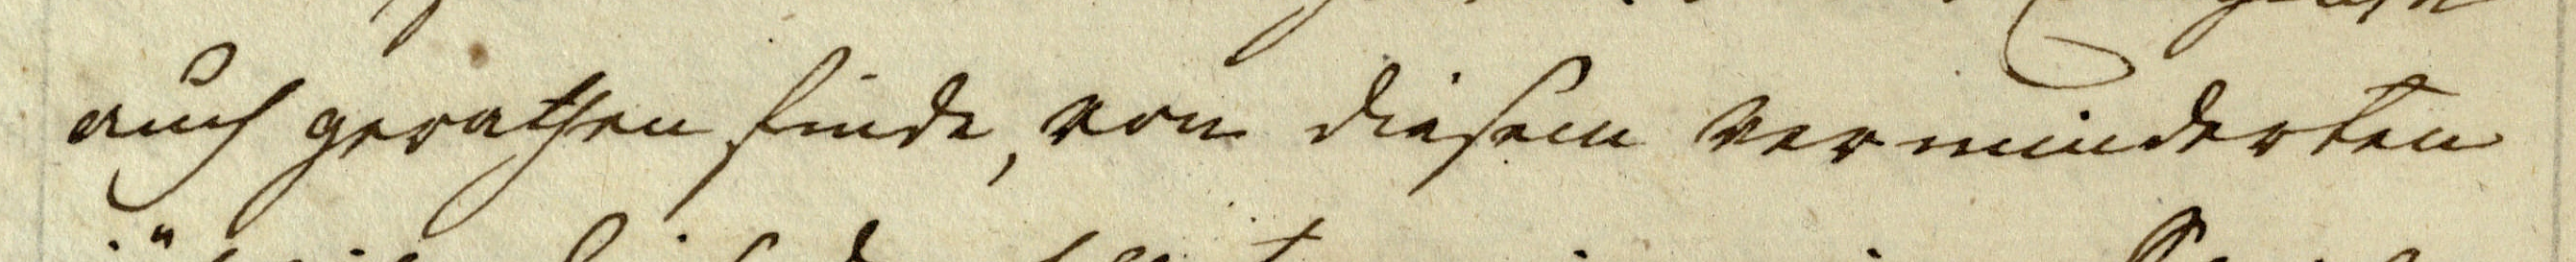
auch gerathen finde, von diesem verminderten
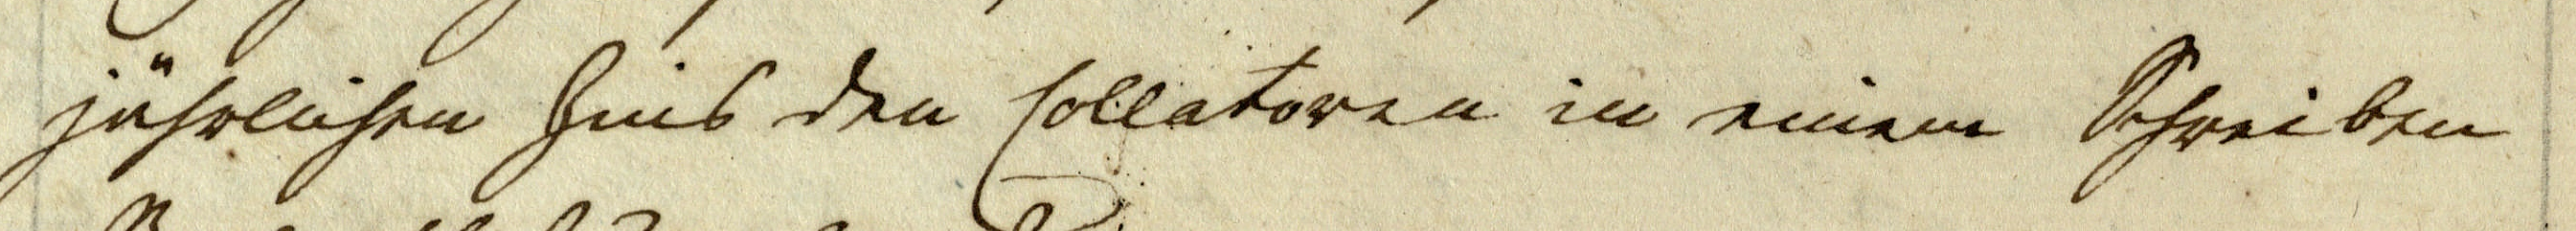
jährlichen Zins den Collatoren in einem Schreiben
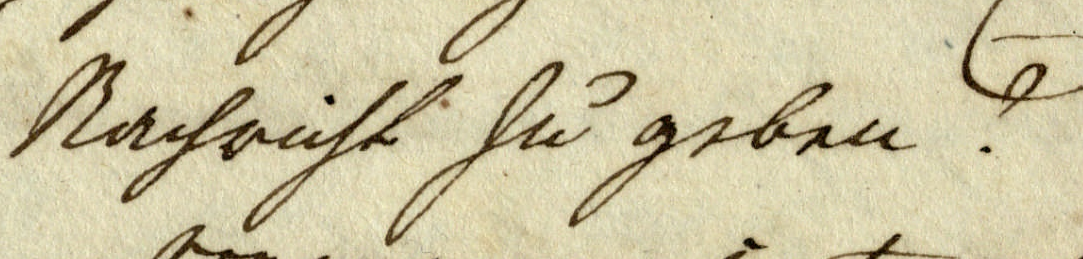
Nachricht zu geben?
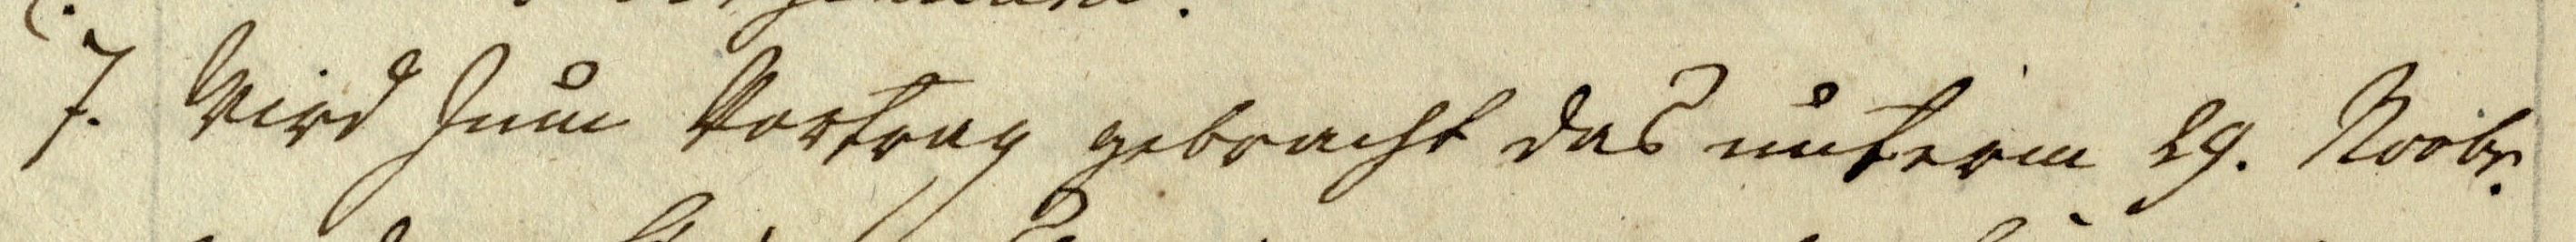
7. Wird zum Vortrag gebracht das unterm 29. Novbr.
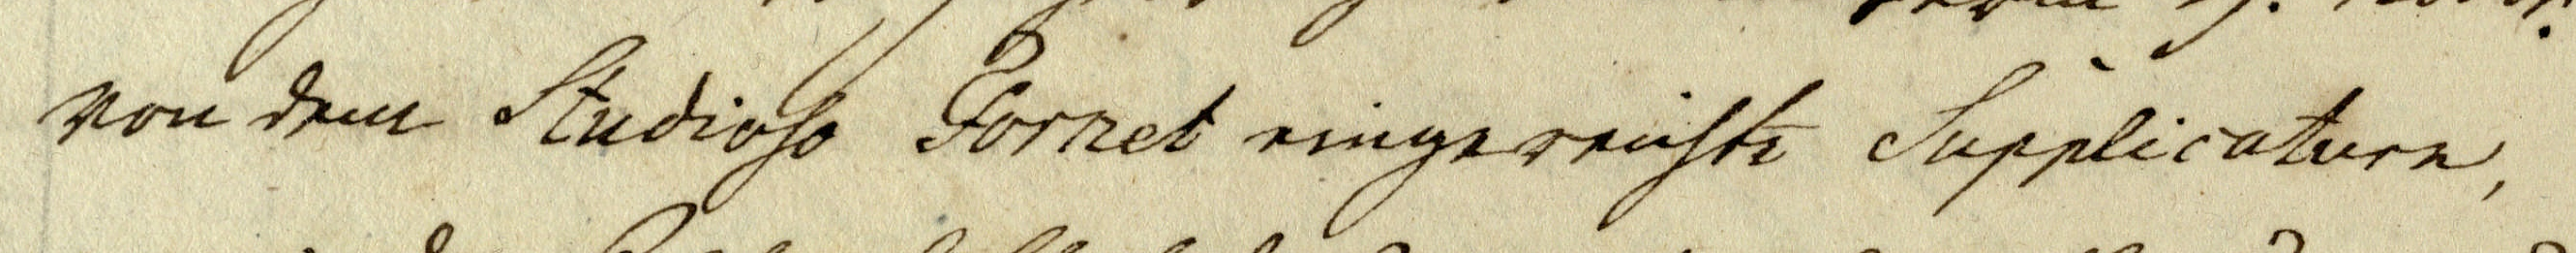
von dem Studioso Fornet eingereichte Supplicatum,
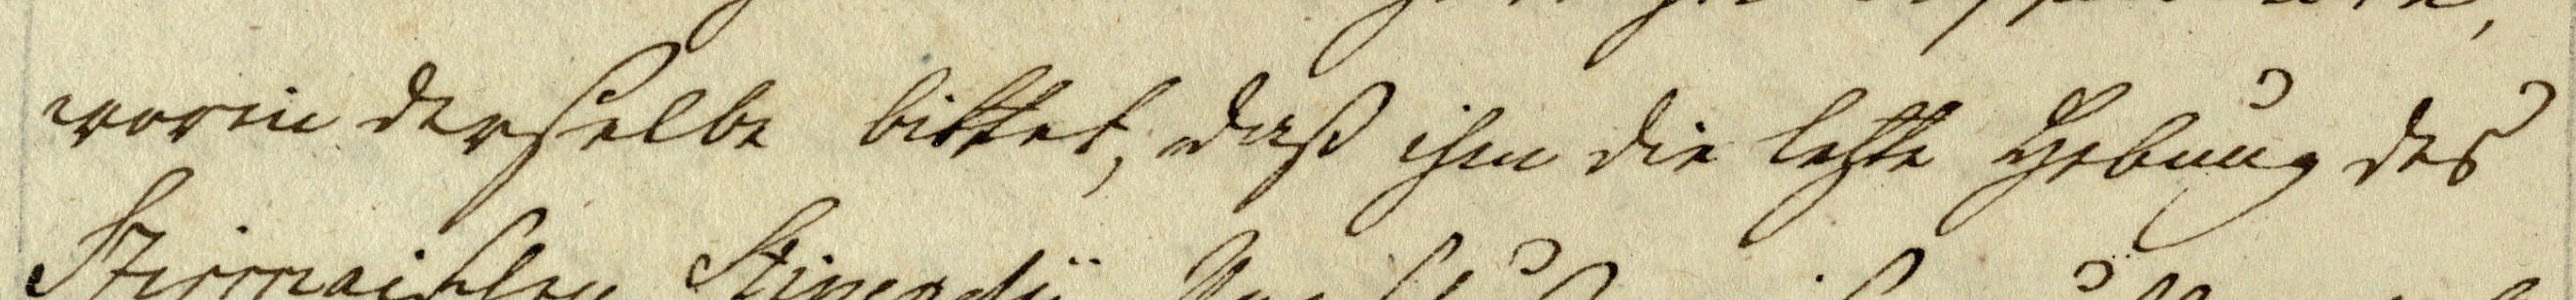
worin derselbe bittet, daß ihm die letzte Hebung des
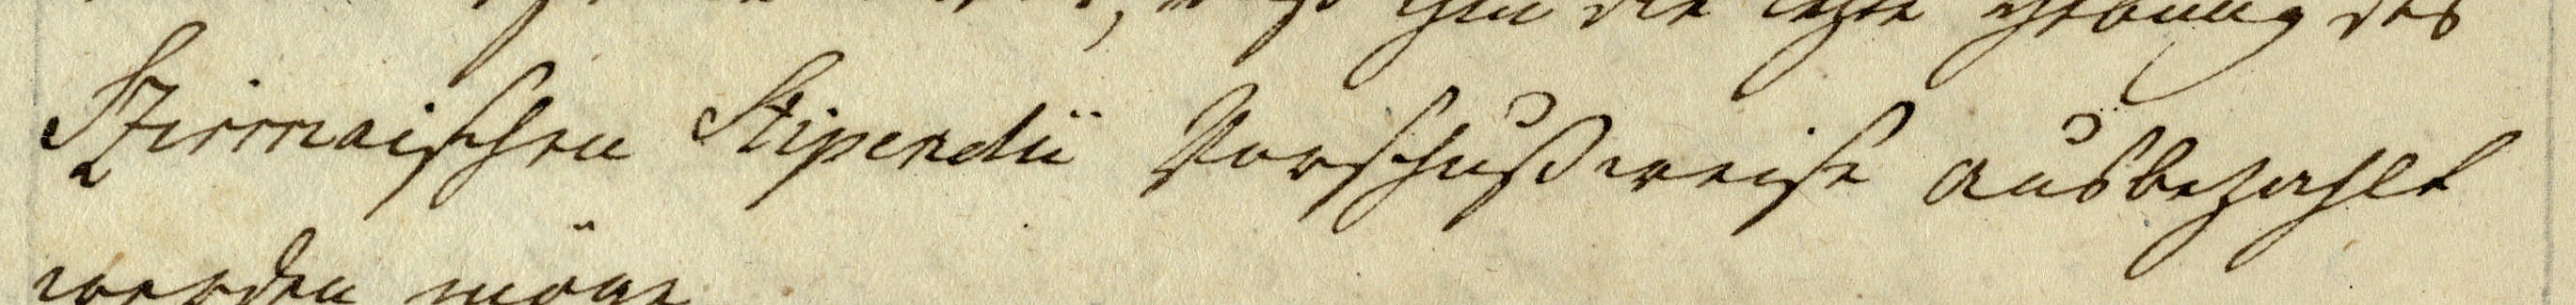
Szirmaischen Stipendii Vorschußweise ausbezahlt
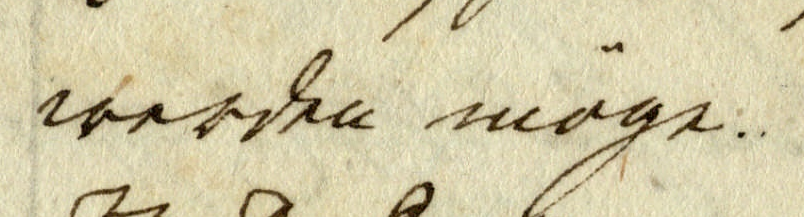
werden möge.
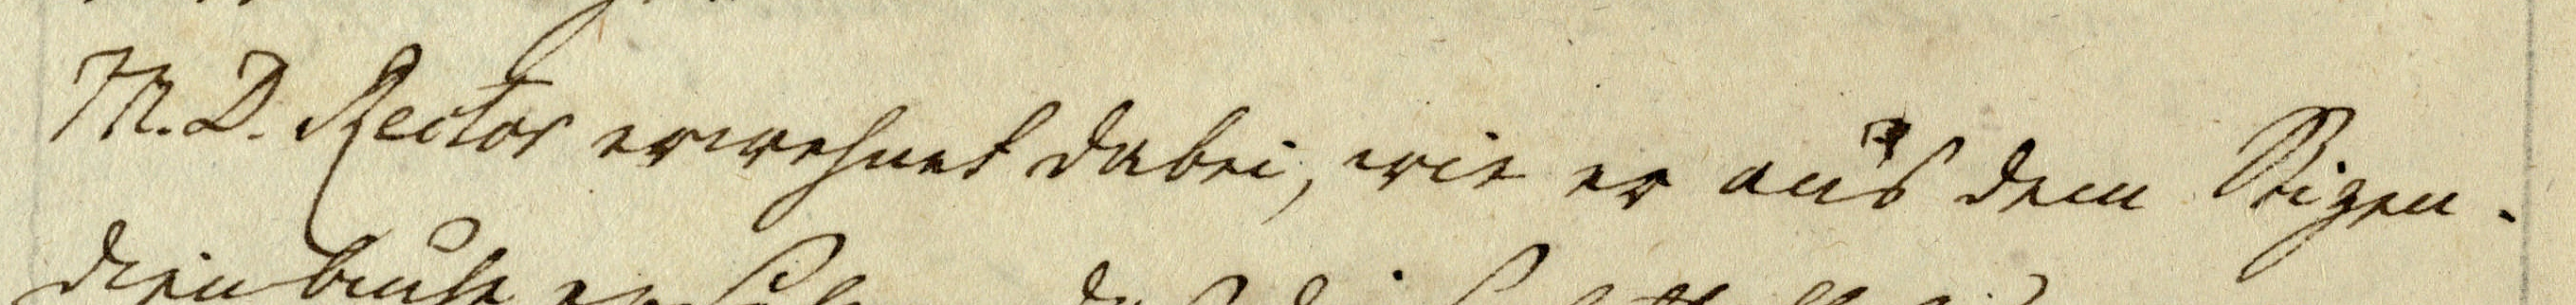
M. D. Rector erwehnet dabei, wie er aus dem Stipen¬
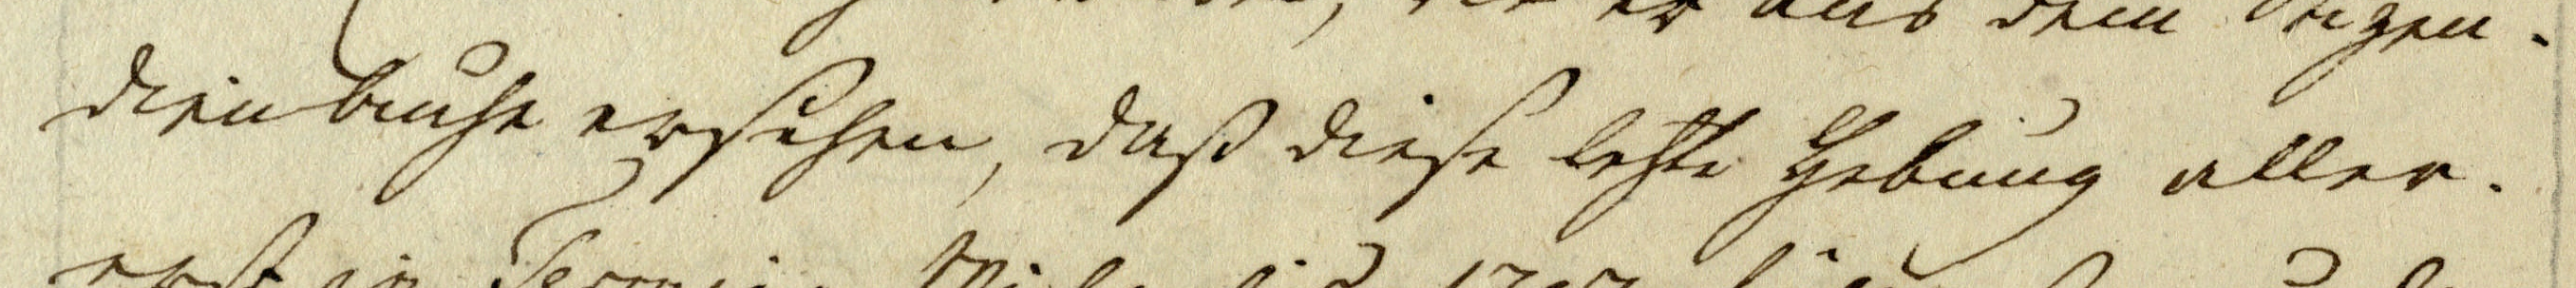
dienbuche ersehen, daß diese letzte Hebung aller¬
